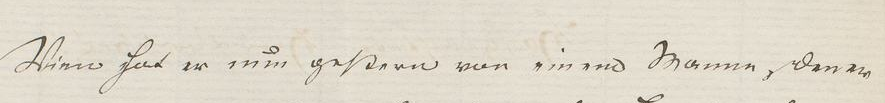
Wien hat er nun gestern von einem Manne, den er
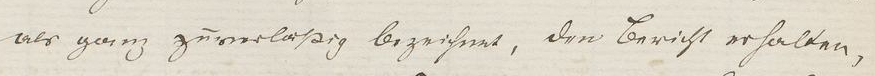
als ganz zuverläßig bezeichnet, den Bericht erhalten,
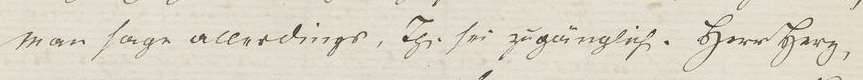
man sage allerdings, Th. sei zugänglich. Herr Herz,
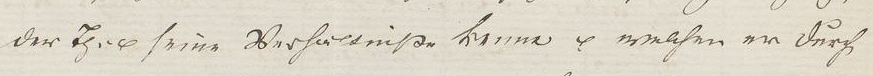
der Th. & seine Verhältniße kenne & welchen er durch
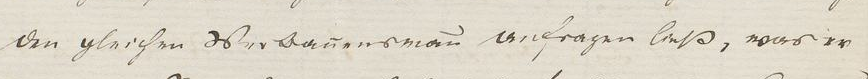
den gleichen Vertrauensmann anfragen ließ, was er
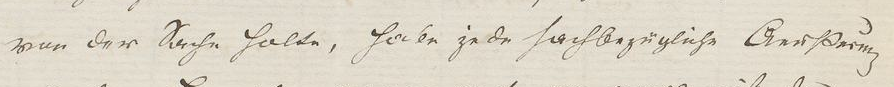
von der Sache halte, habe jede solchbezügliche Aeußerung
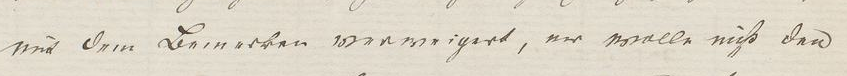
mit dem Bemerken verweigert, er wolle nicht den
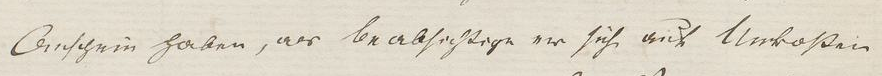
Anschein haben, als beabsichtige er sich auf Unkosten
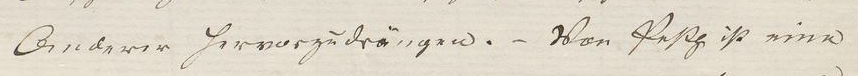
Anderer hervorzudrängen. – Von Pesth ist eine
